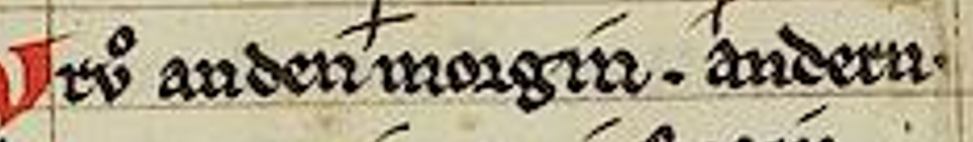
Vrv°o an den °(+) morgin. °(+) andern.
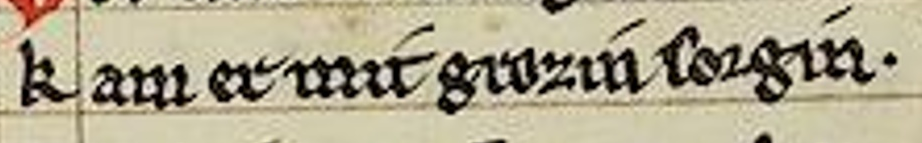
Kam er mit grozin ſorgin.
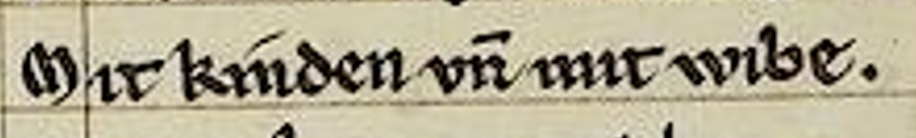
Mit kinden vn(d) mit wibe.
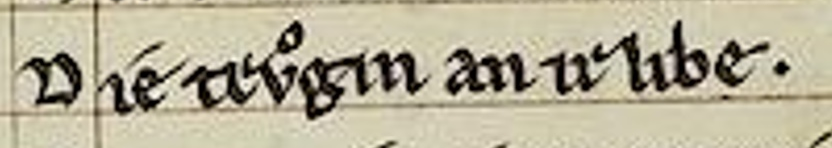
Die trv°ogin an ir libe.
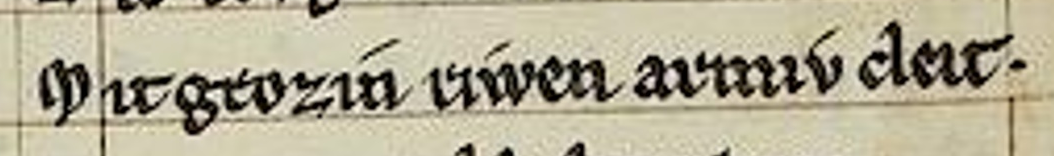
Mit grozin riwen armiv cleit.
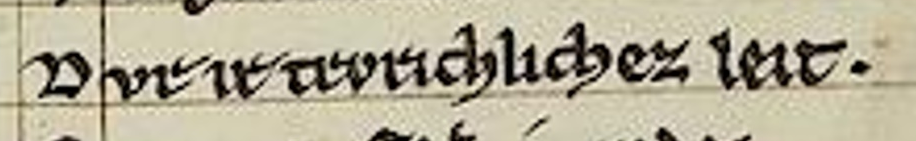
Dvr ir trvrichlichez leit.
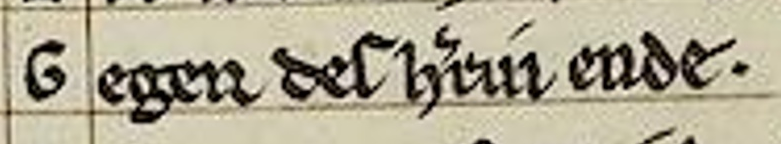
Gegen deſ h(er)rin ende.
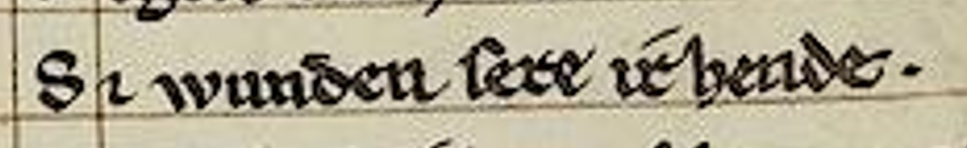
Si wunden ſere ir hende.
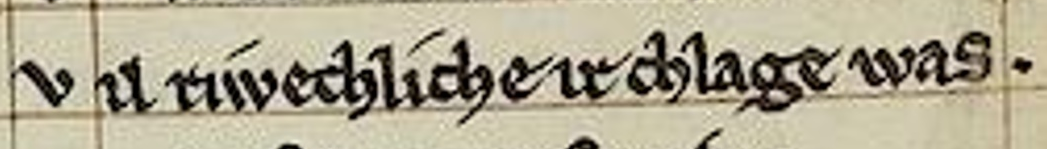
Vil riwechliche ir chlage was.
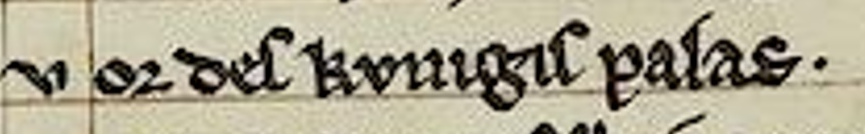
Vor deſ kvnigiſ palas.
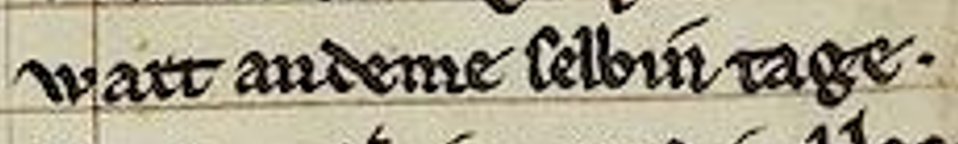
Wart an deme ſelbin tage.
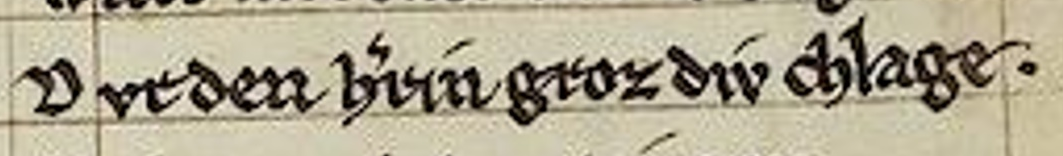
Dvr den h(er)rin groz div chlage.
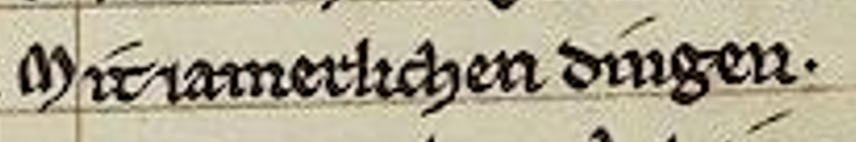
Mit iamerlichen dingen.
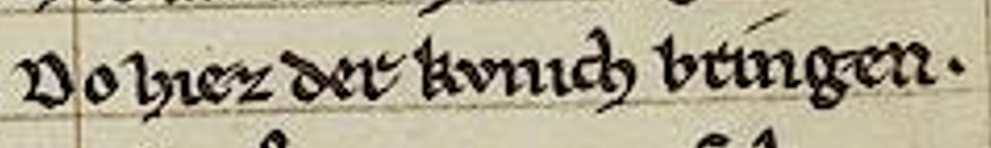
Do hiez der kvnich bringen.
